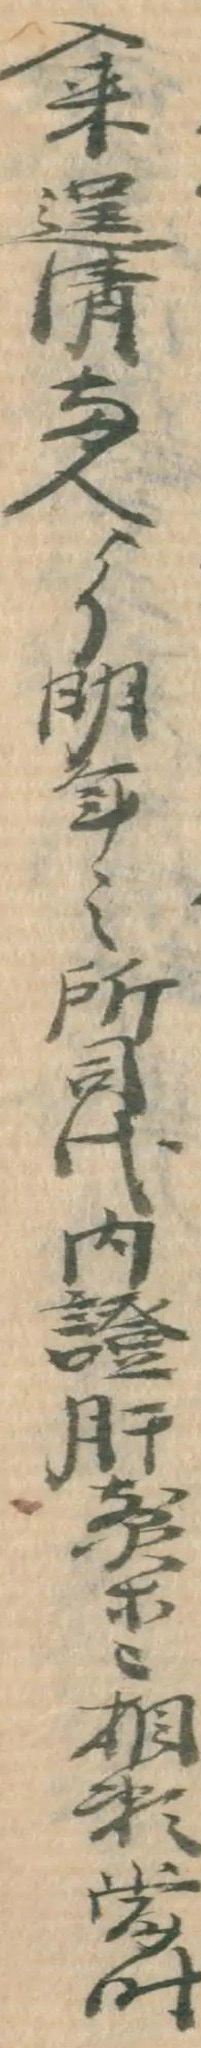入来逞清両人より明年之所司代内證肝煎等被相頼當時

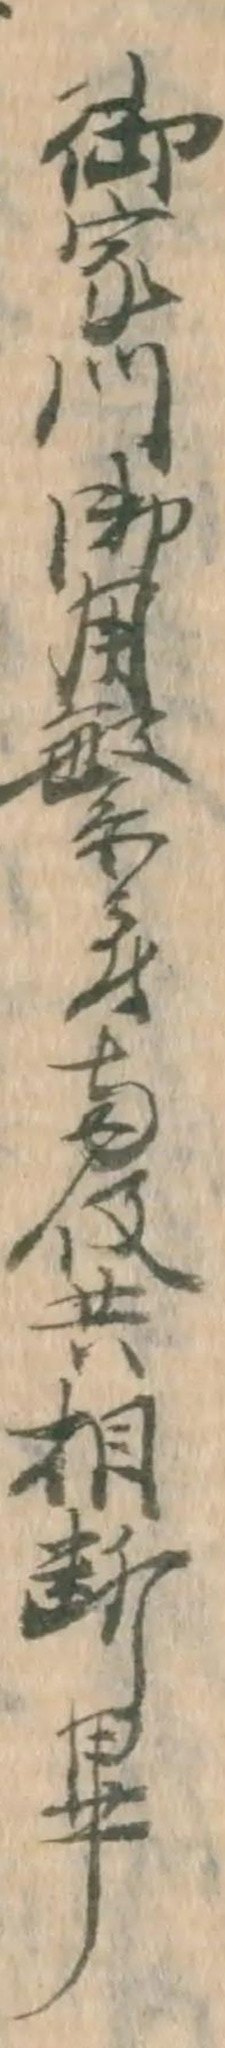御家門御用繁ニ付両役共相断畢
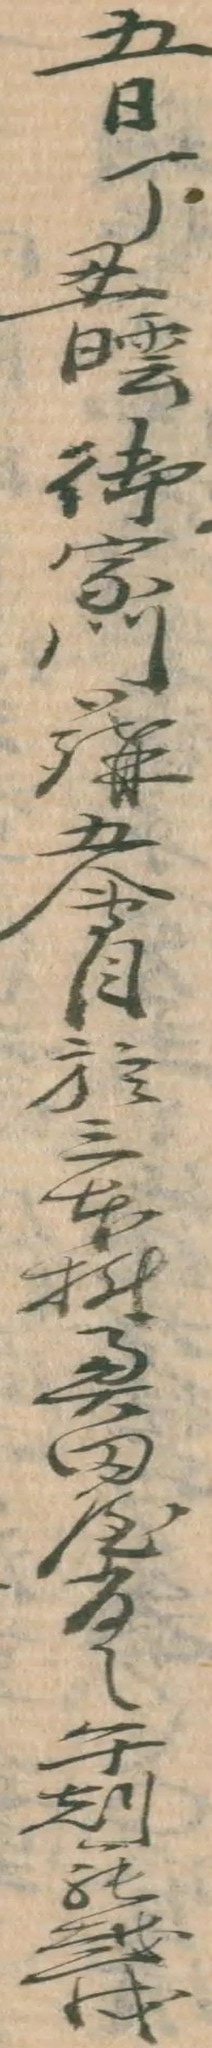五日丁丑曇御家門御講五會自於三本掛奥田屋有之午刻罷越戌
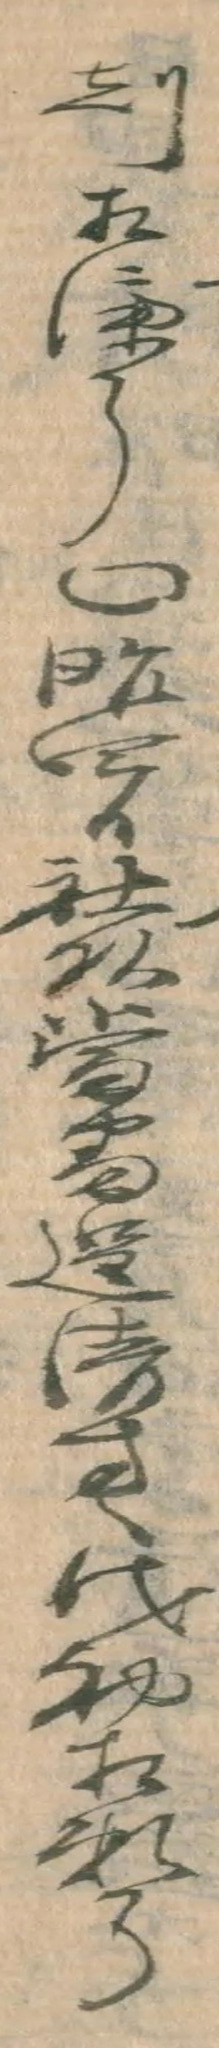刻相済了〇昨四日社頭當番逞清方へ代勤相頼了
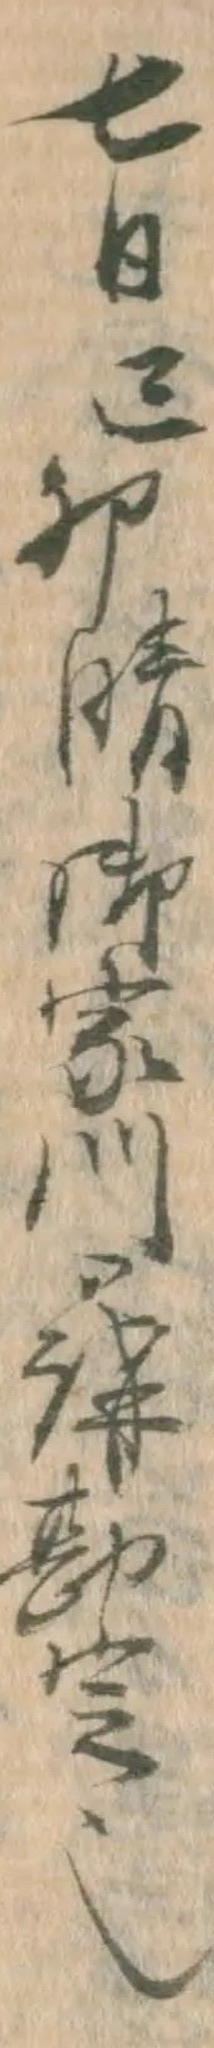七日己卯晴御家門御講勘定也
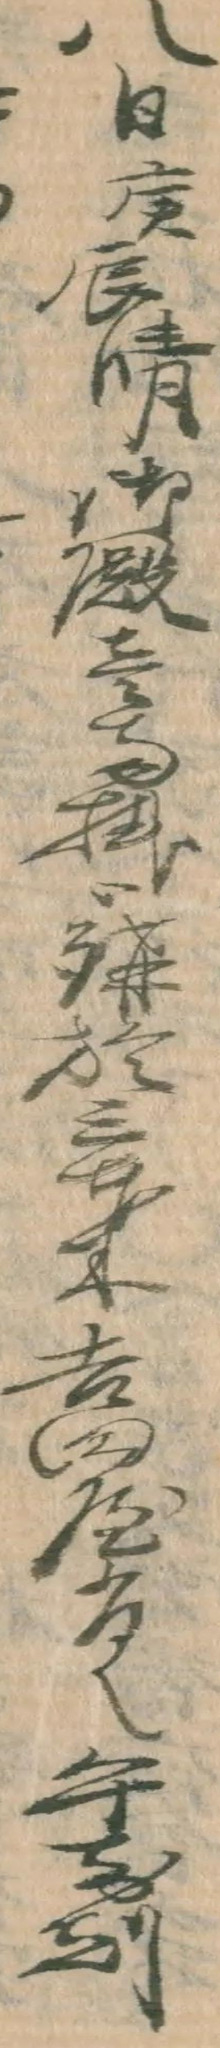八日庚辰晴御殿壱寺掛御構於三本木吉田屋有之午前刻
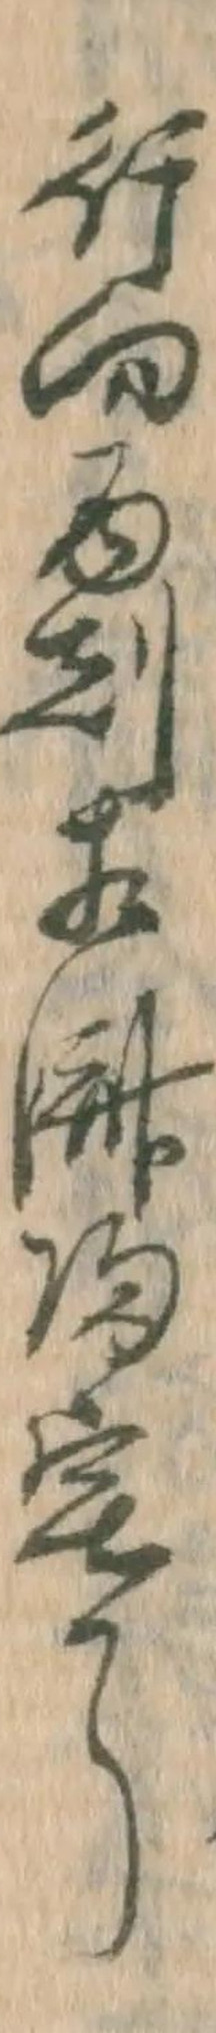行向酉刻相済帰宅了
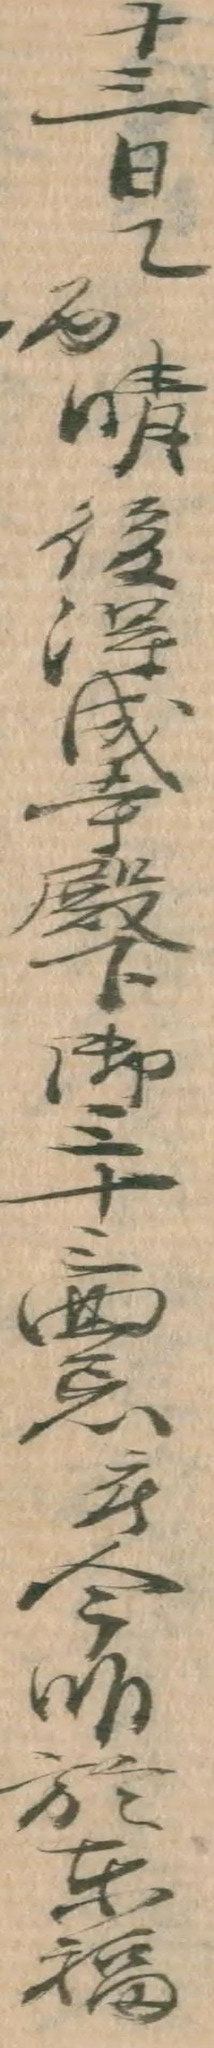十三日乙卯晴後得成寺殿下御三十三回忌ニ付今明於東福
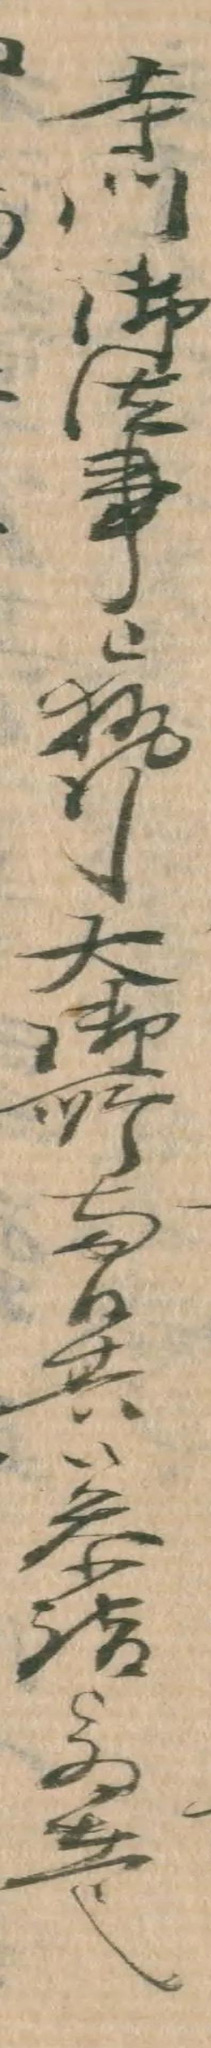寺門御法事被執行大御所両日共御参詣被為在也
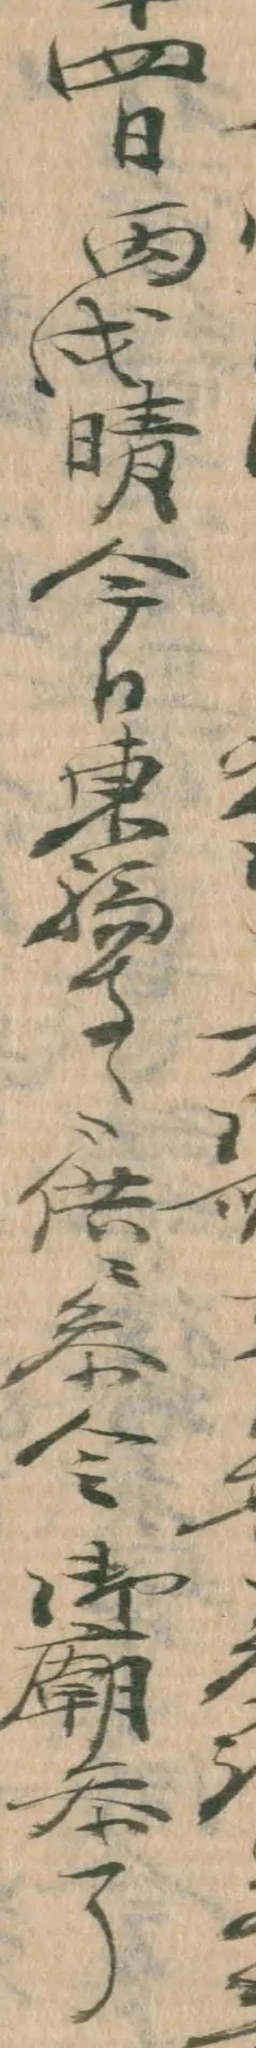十四日丙戌晴今日東福寺へ御供ニ参令御廟参了
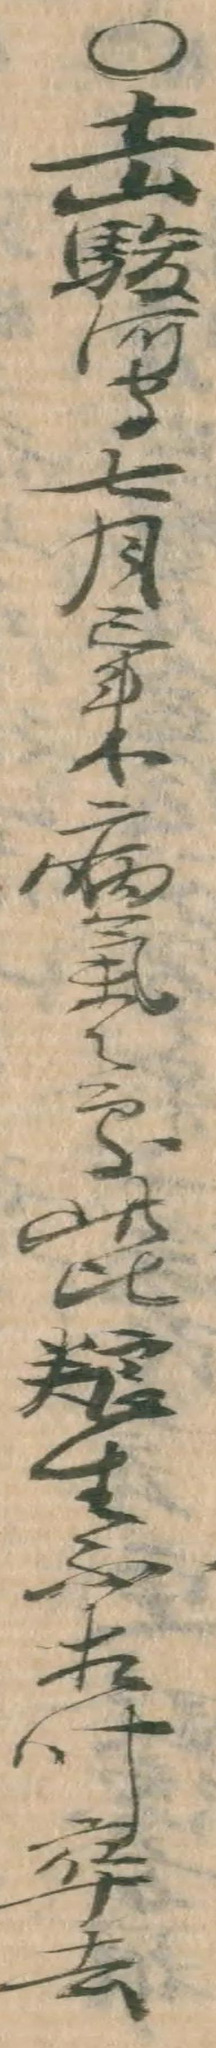○土山駿河守七月已来病氣之處此比羪生不相叶卒去
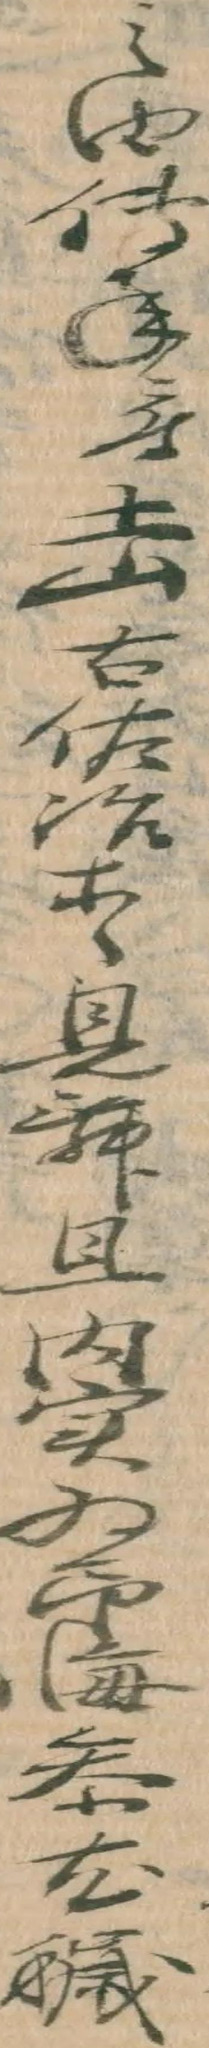之由傳承ニ付土山古佐治等御見舞且内実為予悔参尤穢
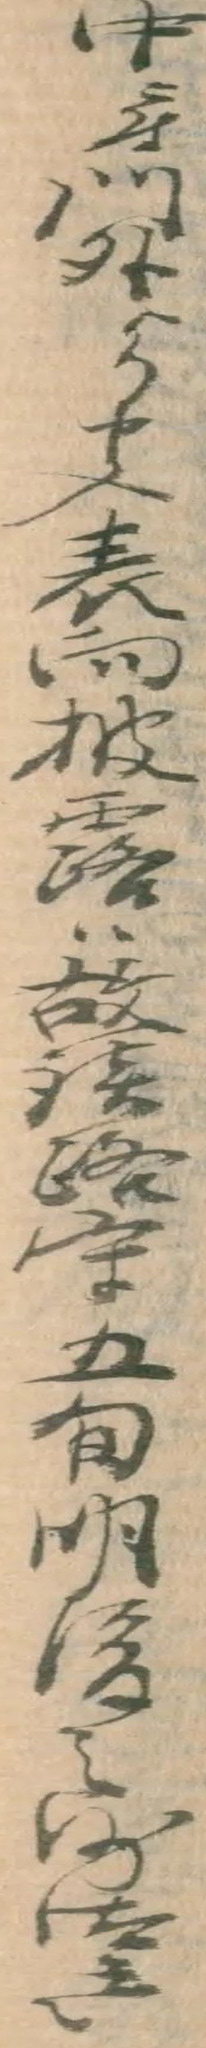中ニ付門外より申入表向披露ハ故讃路守五旬明後之沙汰云々
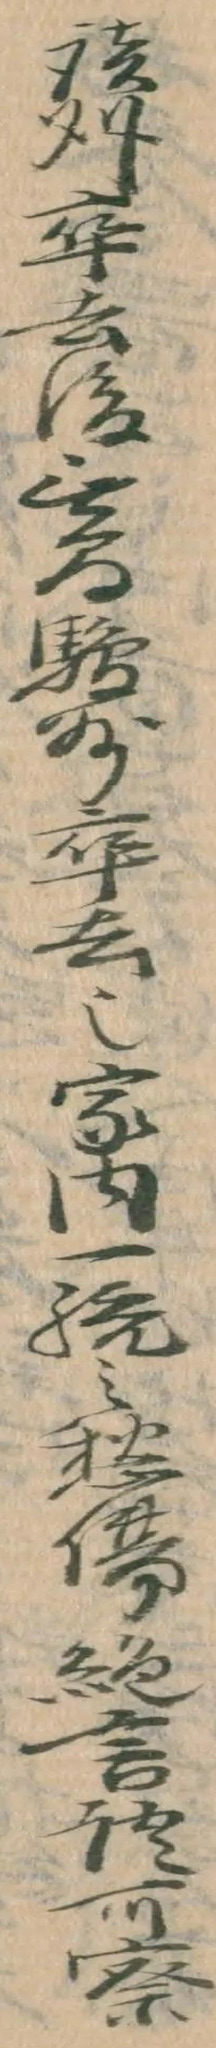讃州卒去後無間駿州卒去也家内一統之愁傷絶言語可察
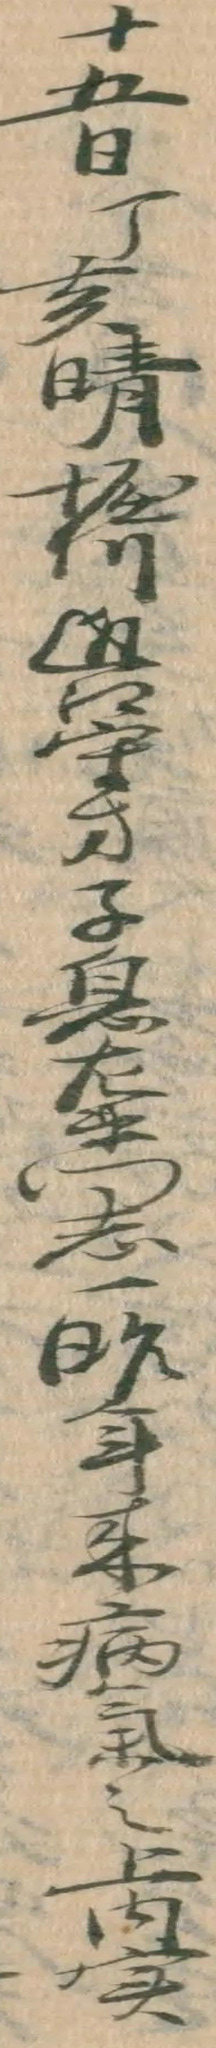十五日丁亥晴堀川近江守方子息左衛門志一昨年来病氣之上内実
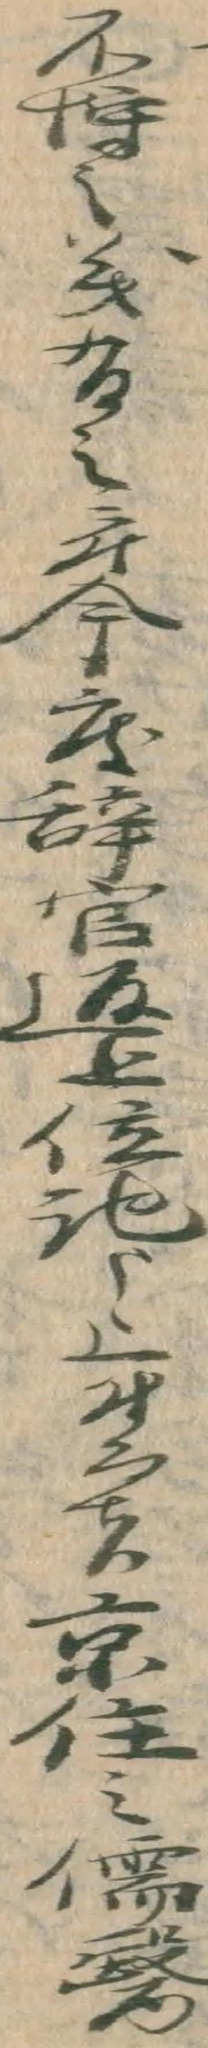不埒之義有之ニ付今度辞官返上位記申上付而者京住之儒醫
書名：賀茂社記録. 第65冊
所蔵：国立国会図書館 National Diet Library, JAPAN
